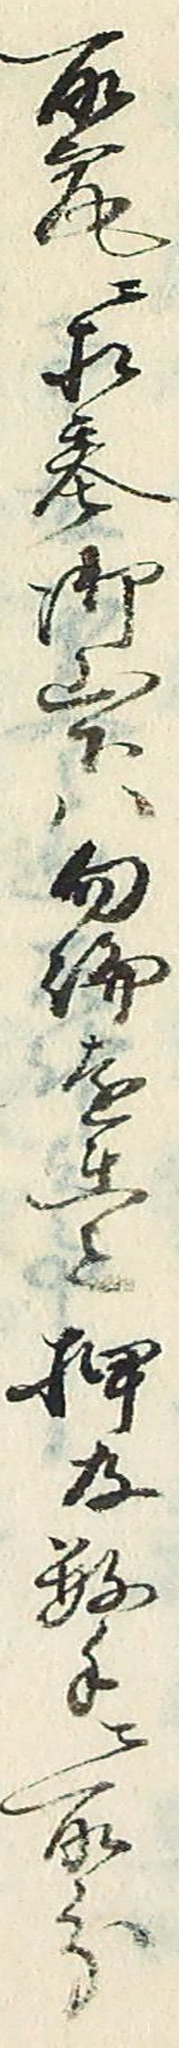取究ニ相基御山下ハ勿論遠在迄押及数手ニ取分
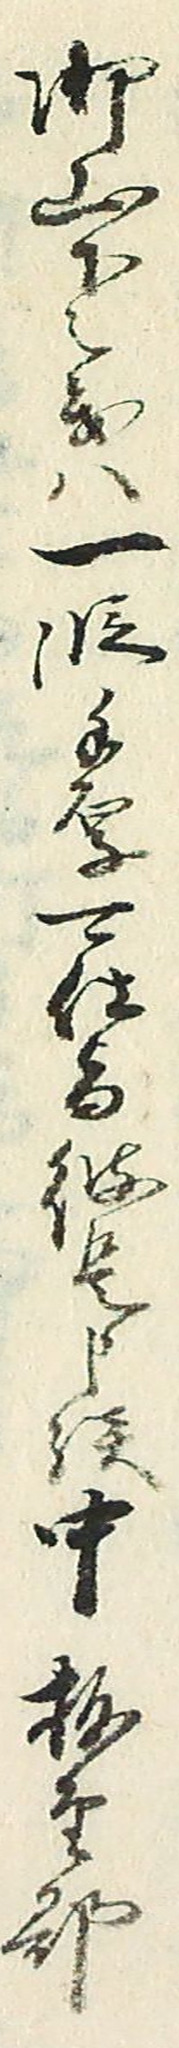御山下之義ハ一段手厚可仕旨彼是申談中板野郡
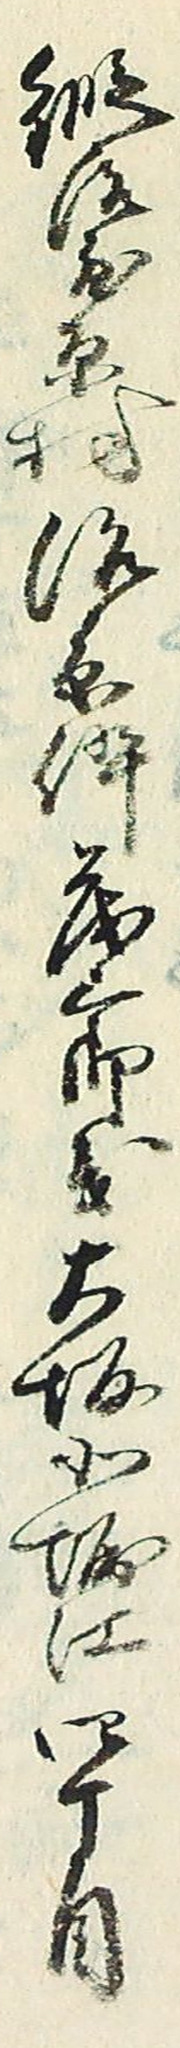鍛冶屋原村次兵衛伜茂三郎義大坂北堀江四丁目
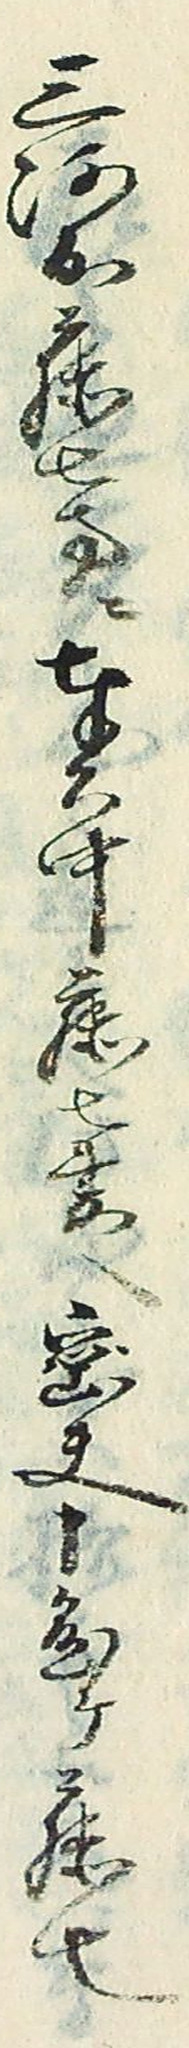三河屋藤七方ニ奉公中藤七妻へ密夫申懸ケ藤七
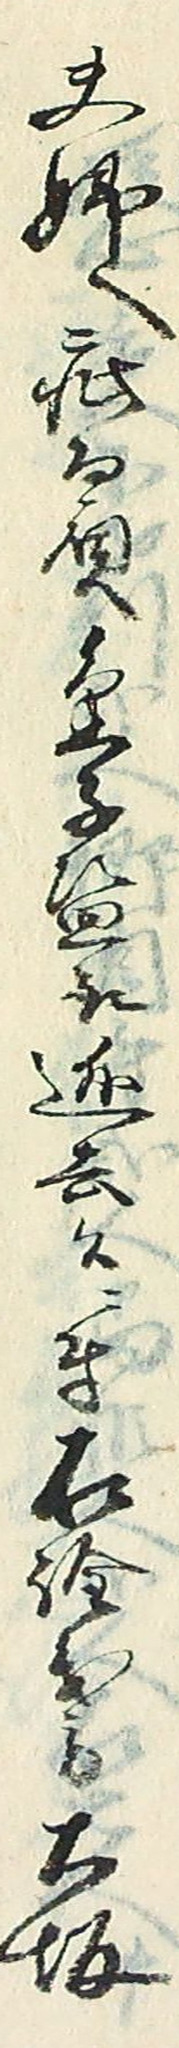夫婦へ疵為負金子盗取迯去候ニ付右詮義方大坂
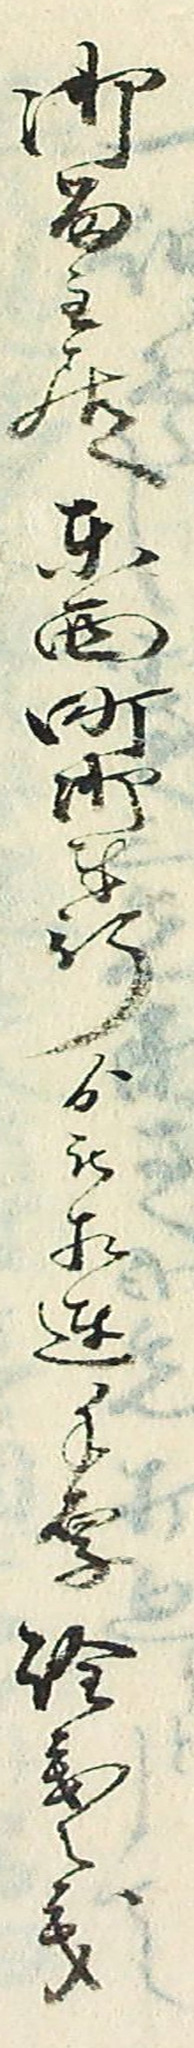御留主居へ東西町奉行ゟ被相達手厚詮義之義
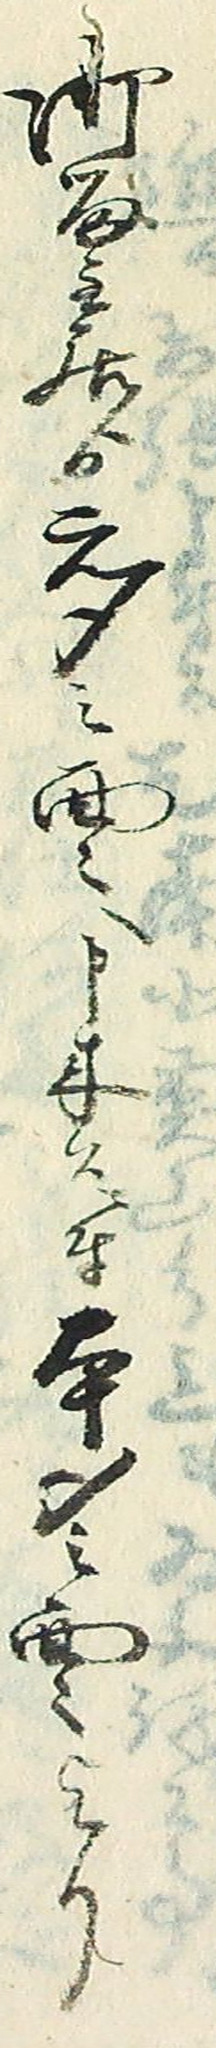御留主居ゟ元〆之面々へ申来候ニ付本〆之面々より
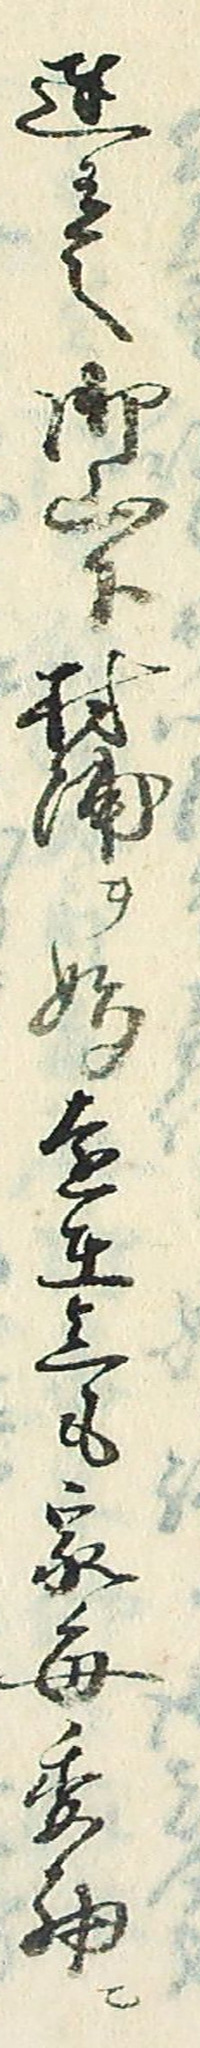達有之御山下村浦ヲ始メ遠在迄も家毎委細ニ
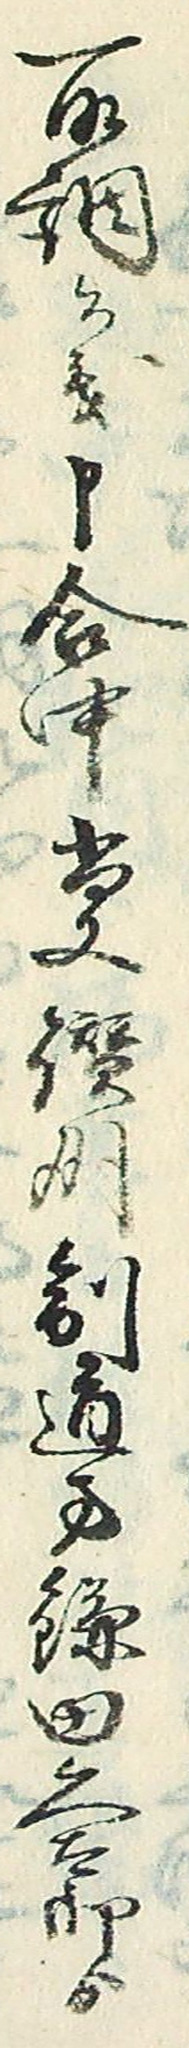取調候義申合中尚又讃州制道方鎌田久太郎ゟ
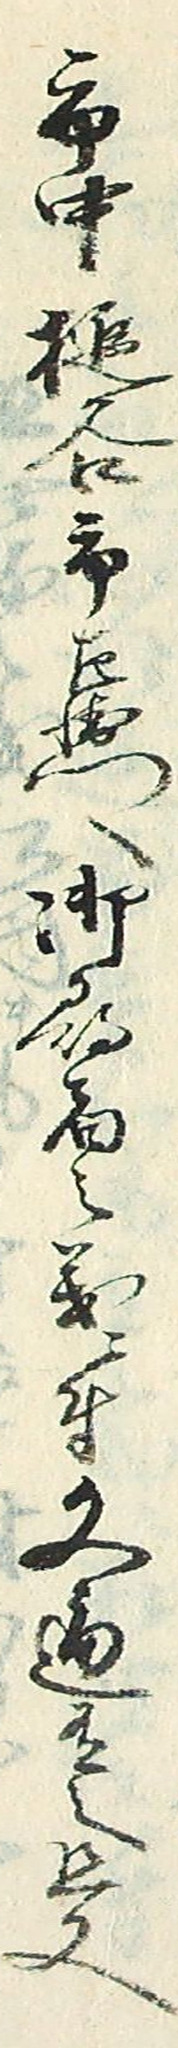市中槌谷市左衛門へ御尋者之義ニ付文通有之且又
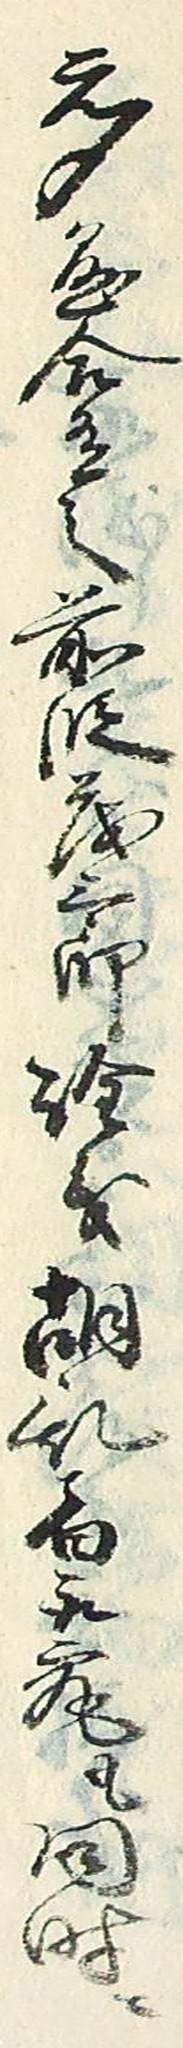元〆懸合有之前段茂三郎詮義胡乱者取究も同時ニ
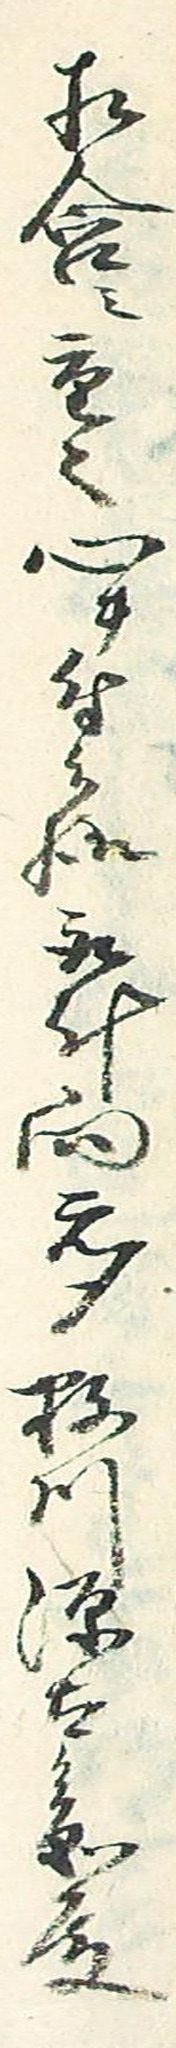相含ミ重々心ヲ付候様取計向元〆数川源太兵衛殿

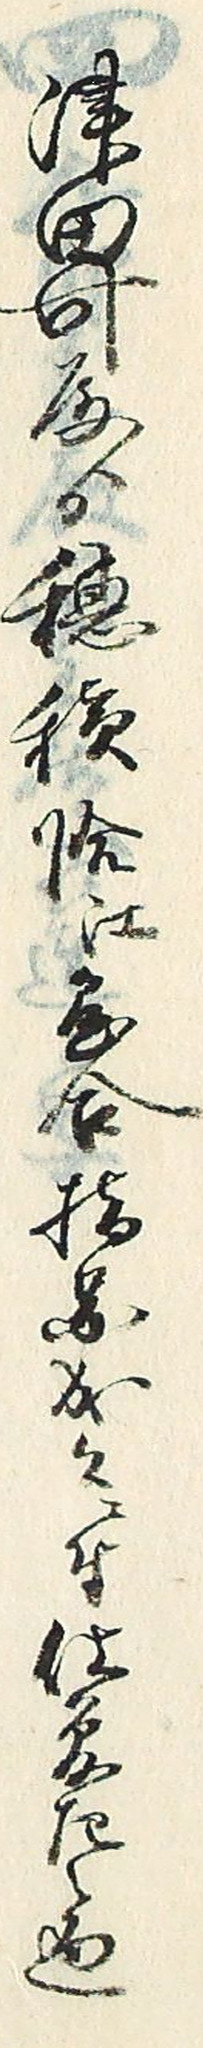津田叶殿ゟ穂積恰江懸合指圖成候ニ付仕管左之通
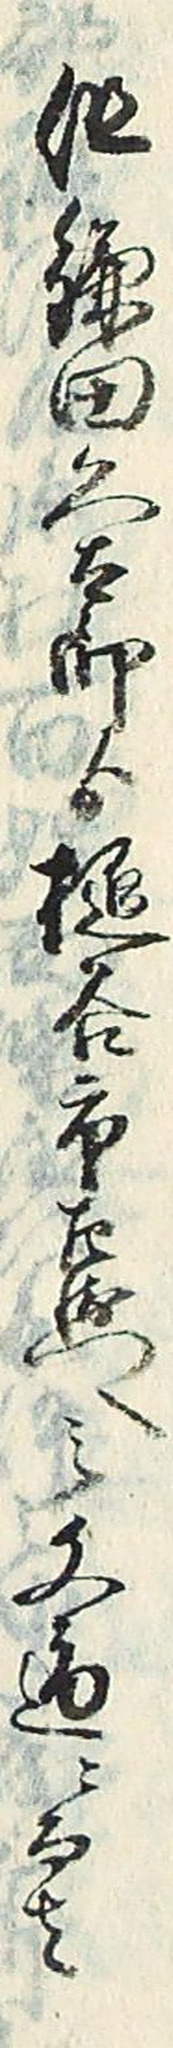但鎌田久太郎ゟ槌谷市左衛門へ之文通ニ而者
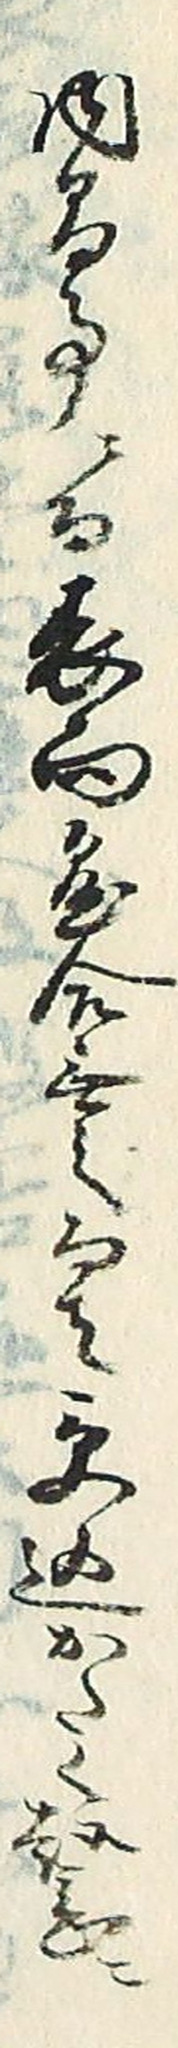内間事ニ而表向懸合無之而者交込かたく趣意ニ
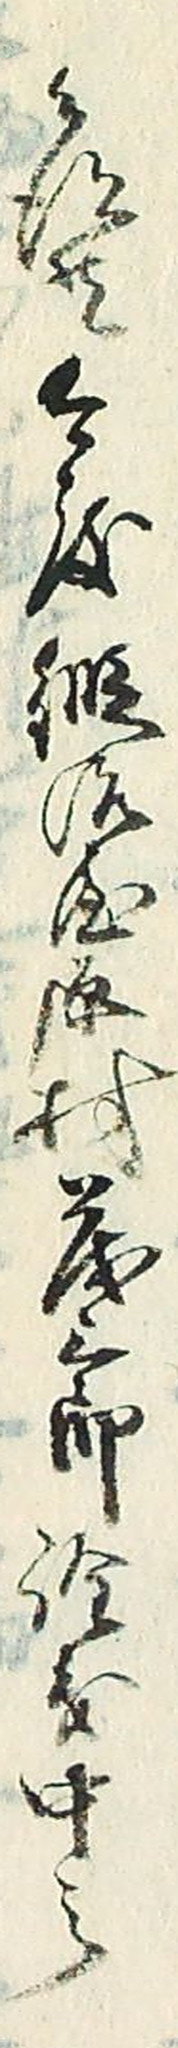候得共今度鍛冶屋原村茂三郎詮義中之
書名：諸御趣意書并御下知向之写
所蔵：鳴門教育大学 Naruto University of Education
